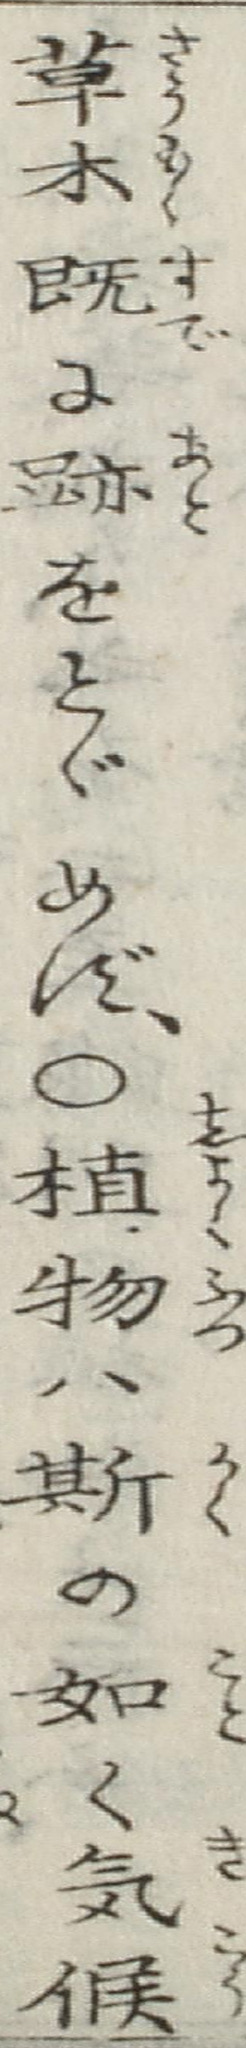草木既に跡をとゞめず、○植物は斯の如く気候
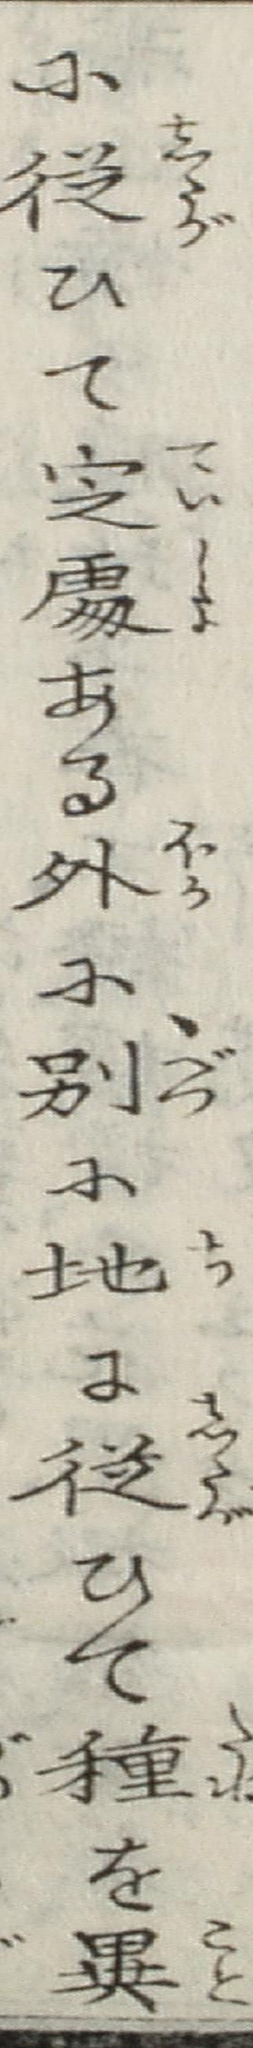に従ひて定処ある外に、別に地に従ひて種を異
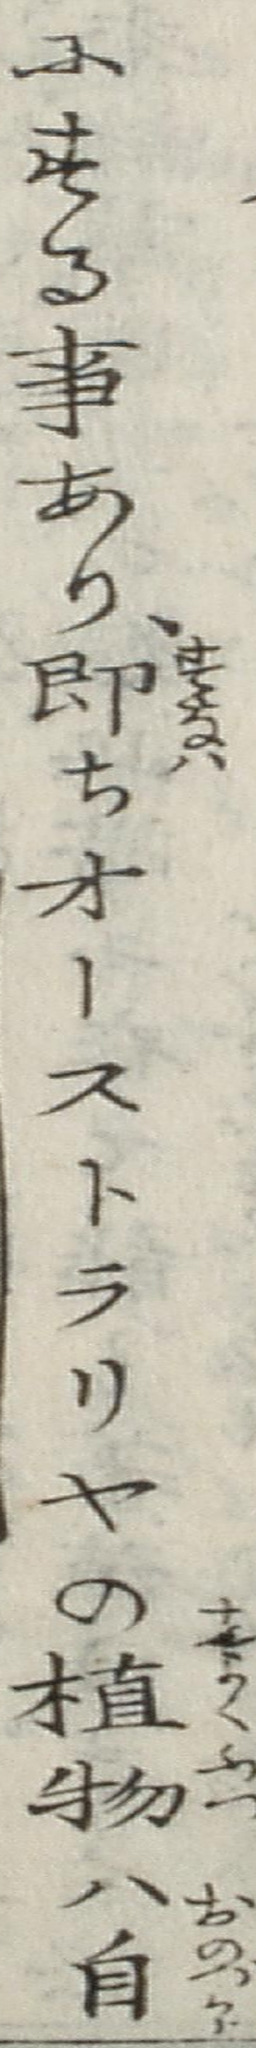にする事あり、即ちオーストラリヤの植物は自
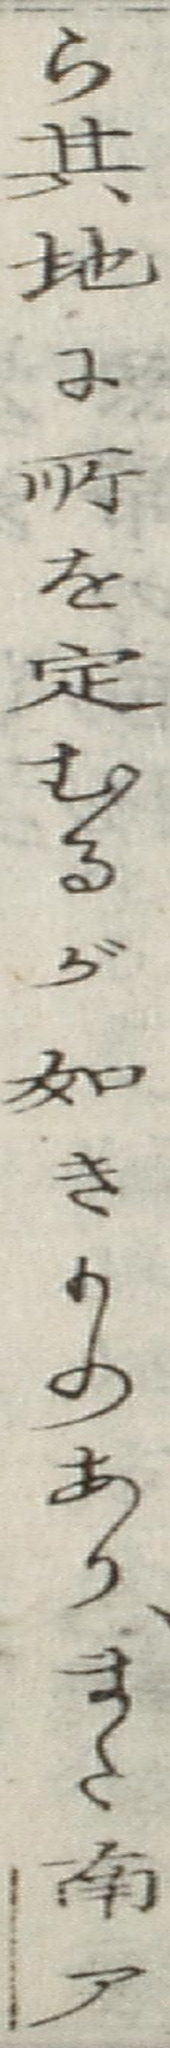ら其地に所を定むるが如きものあり、また南ア
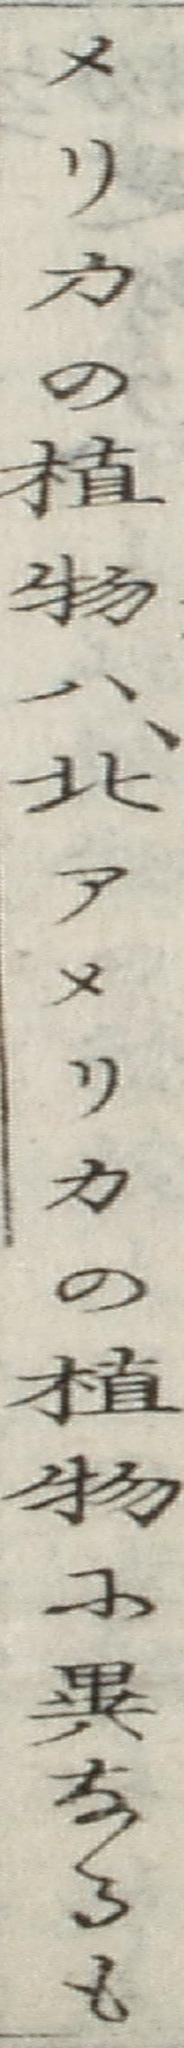メリカの植物は、北アメリカの植物に異なるも
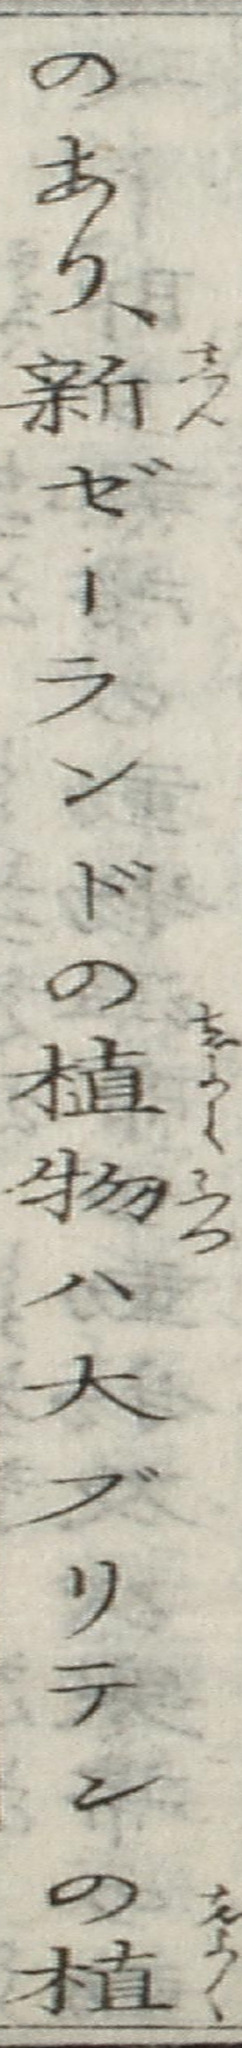のあり、新ゼーランドの植物は大ブリテンの植
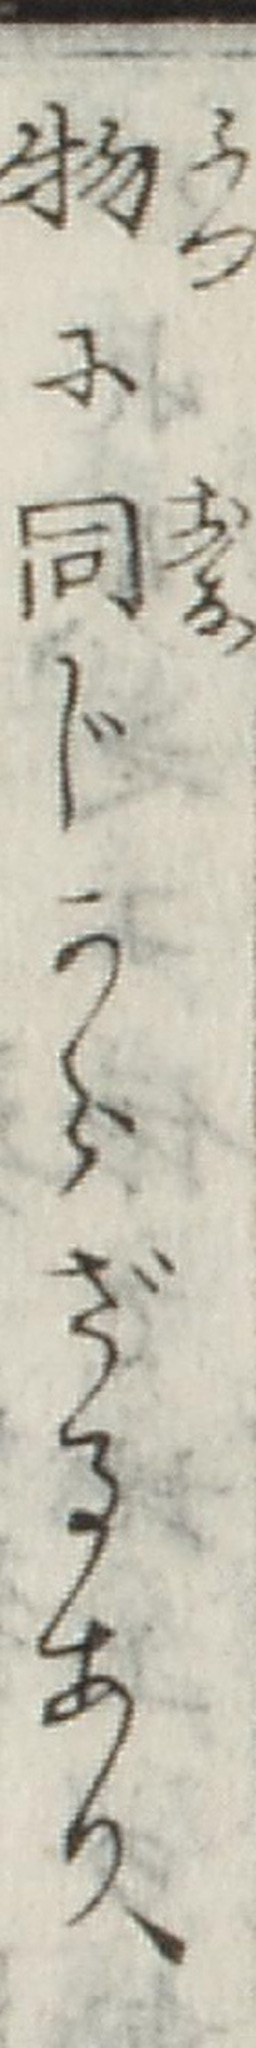物に同じからざるあり、
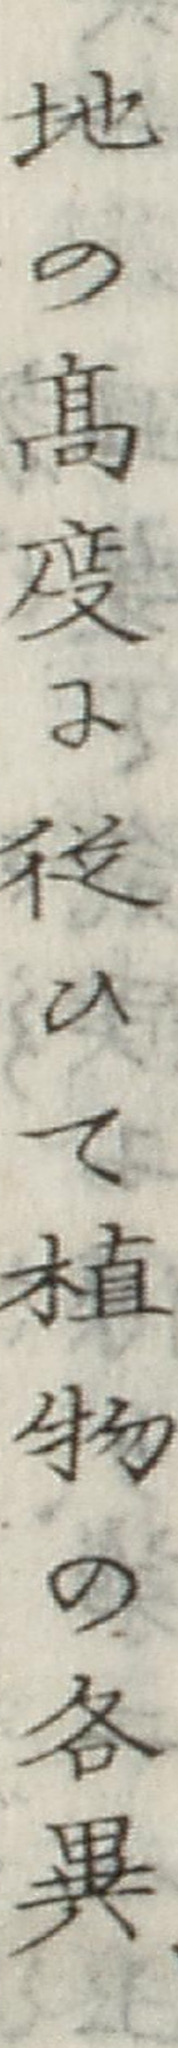地の高度に従ひて植物の各異、
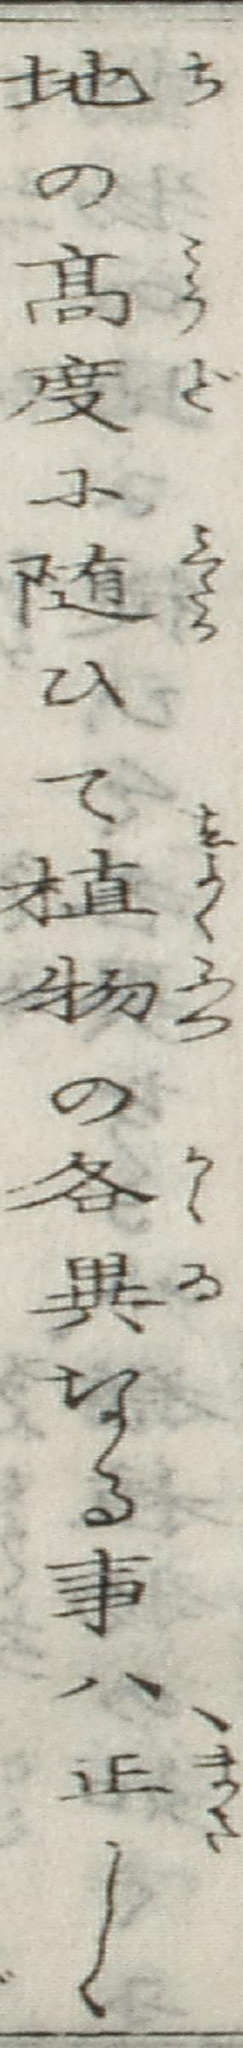地の高度に随ひて植物の各異なる事は、正しく
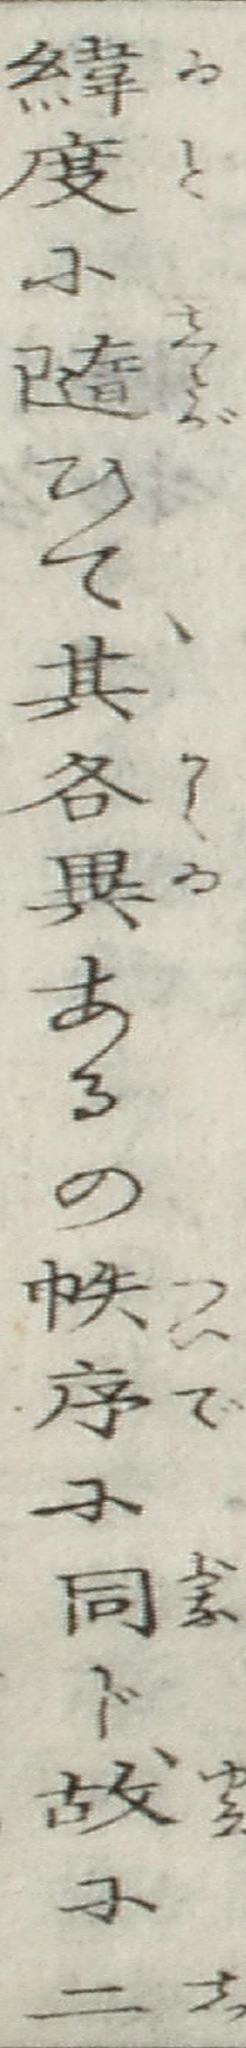緯度に随ひて、其各異あるの帙序に同じ、故に二
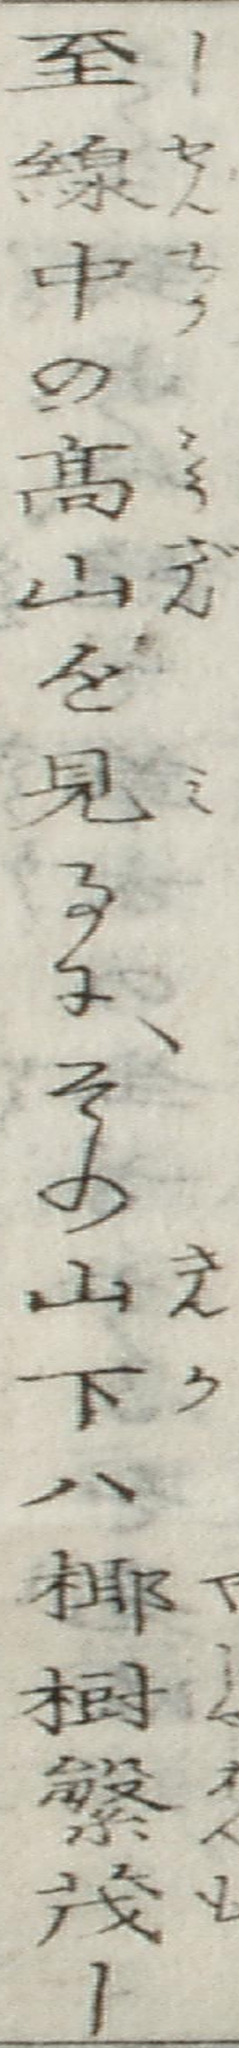至線中の高山を見るに、その山下は椰樹繁茂し
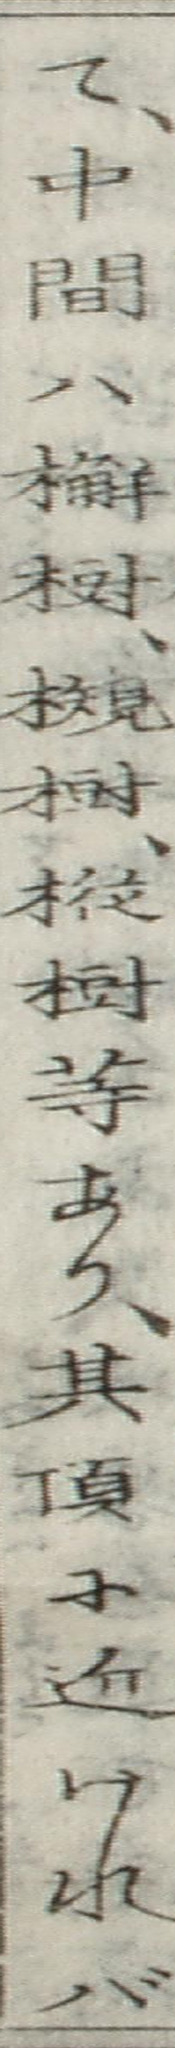て、中間は槲樹、槻樹、樅樹等あり、其頂に近ければ

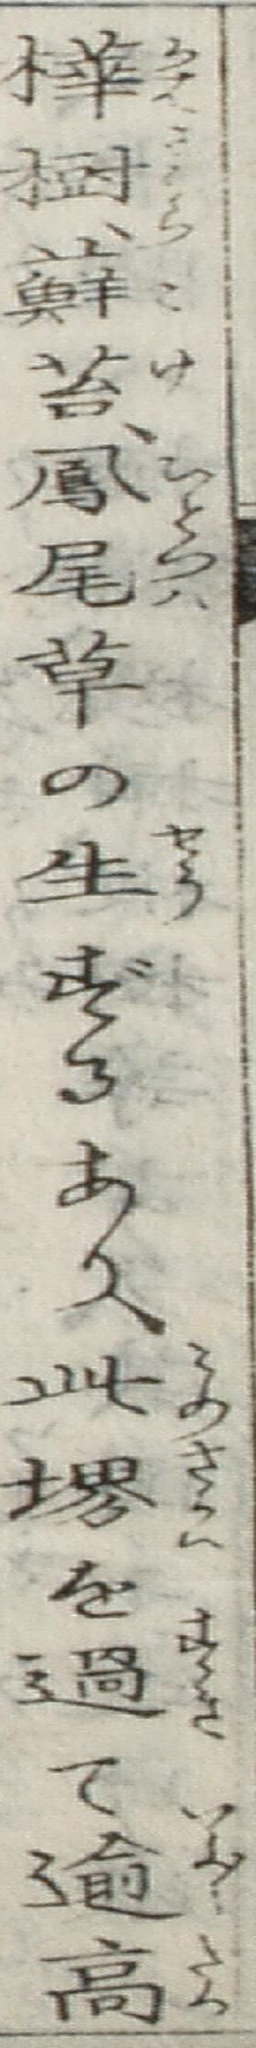樺樹、蘚苔、鳳尾草の生ずるあり、此境を過て愈高
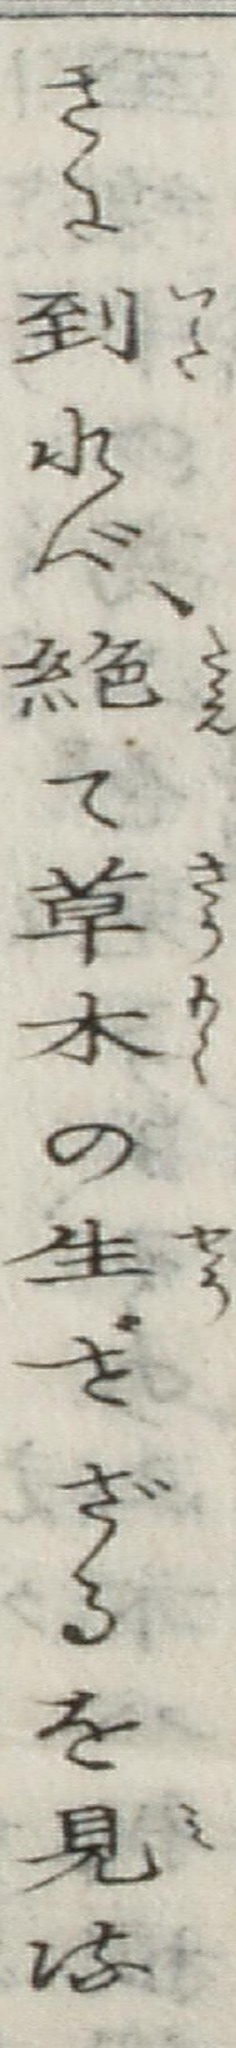きに到れば、絶て草木の生ぜざるを見る
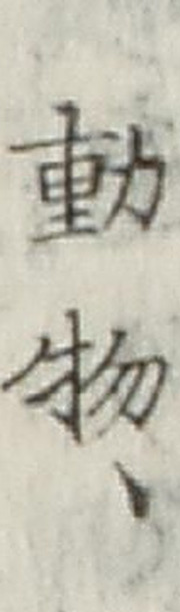動物、
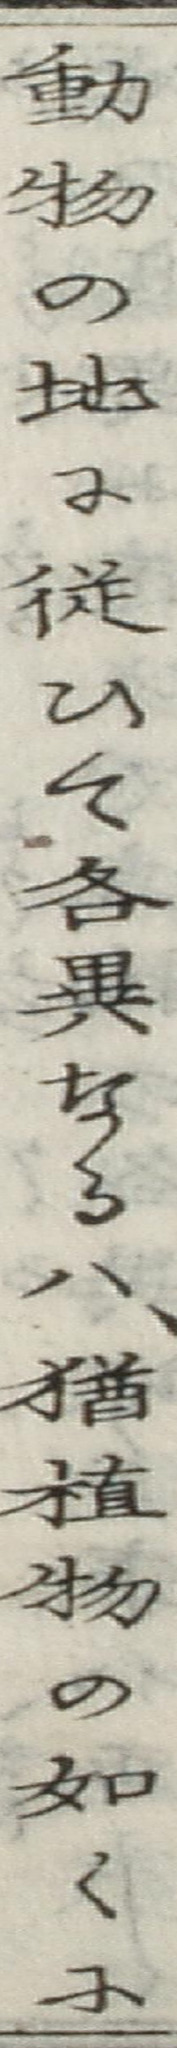動物の地に従ひて各異なるは、猶植物の如くに
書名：訓蒙　天然地理學　下
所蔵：東京大学地震研究所図書室 Earthquake Research Institute Library, The University of Tokyo, JAPAN
